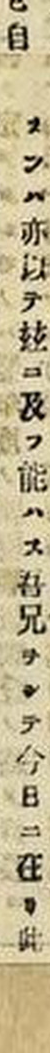スンハ亦以テ玆ニ及フ能ハス吾兄ヲシテ今日ニ在リ此
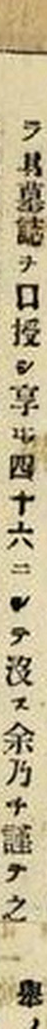ラ其墓誌ヲ口授シ享年四十六ニシテ沒ス余乃チ謹テ之
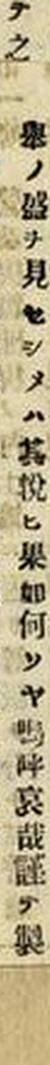擧ノ盛ヲ見セシメハ其悦ヒ果如何ソヤ嗚呼哀哉謹テ製
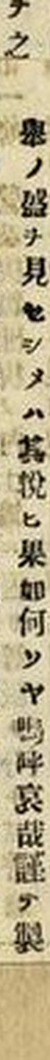擧ノ盛ヲ見セシメハ其悦ヒ果如何ソヤ嗚呼哀哉謹テ製
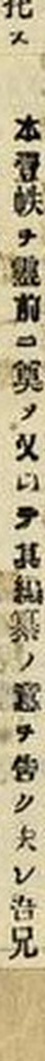本壹帙ヲ靈前ニ奠シテ又以テ其編纂ノ意ヲ告ク其夫レ吾兄
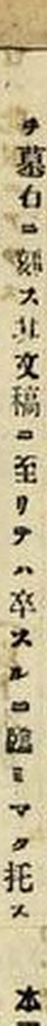ヲ墓石ニ刻ス其文稿ニ至リテハ卒スルニ臨ミマタ托ス
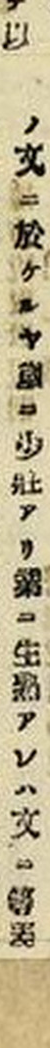ノ文ニ於ケルヤ感ニ少壯アリ第一生熟アレハ文ニ等差
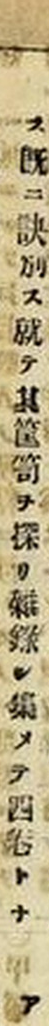ス既ニ訣別ス就テ其筐笥ヲ探リ雜録シ集メテ四巻トナ
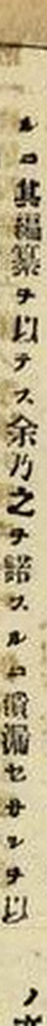ルニ其編纂ヲ以テス余乃之ヲ諾スルニ讀漏セサンヲ以
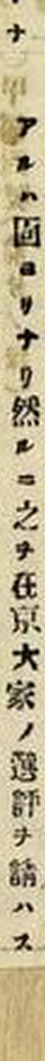アルハ固ヨリナリ然ルニ之ヲ在京大家ノ選評ヲ請ハス
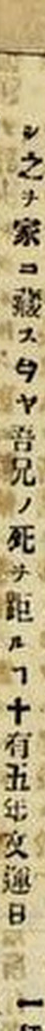シ之ヲ家ニ藏ス今ヤ吾兄ノ死ヲ距ルヿ十有五年文運日
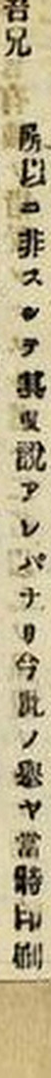所以ニ非スシテ其又説アレバナリ今此ノ擧ヤ當時印刷
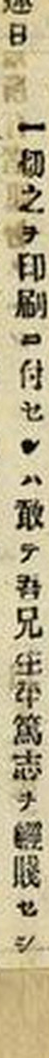一切之ヲ印刷ニ付セシハ敢テ吾兄生平篤志ヲ輕賤セシ
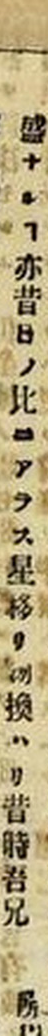盛ナルヿ亦昔日ノ比ニアラスニア星移リ換ハリ昔日吾兄
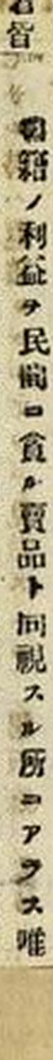図籍ノ利益ヲ民間ニ貪ル賣品ト同視スル所アラス唯
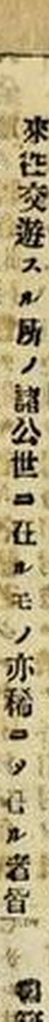來往交遊スル所ノ諸公世ニ在ルモノ亦稀ニシテ在ル者皆
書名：温古集 四巻
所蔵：福井県文書館 Fukui Prefectural Archives
